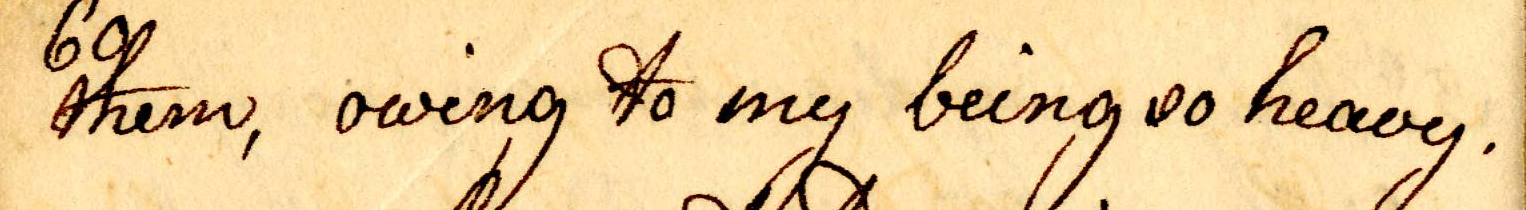them, owing to my being so heavy.
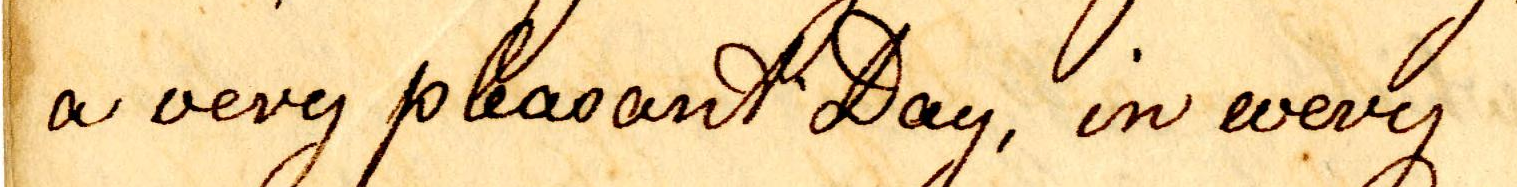a very pleasant Day, in every
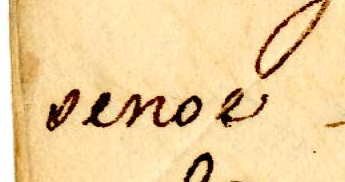sense
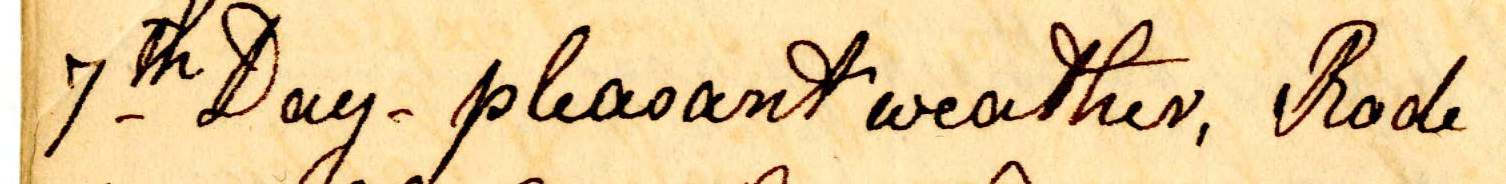7^th Day- pleasant weather, Rode
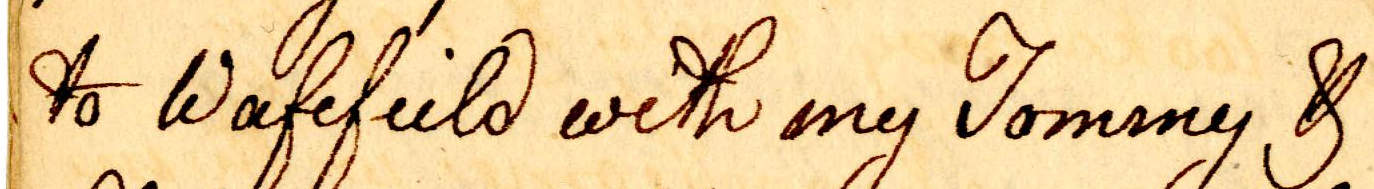to Wafefeild with my Tommy &
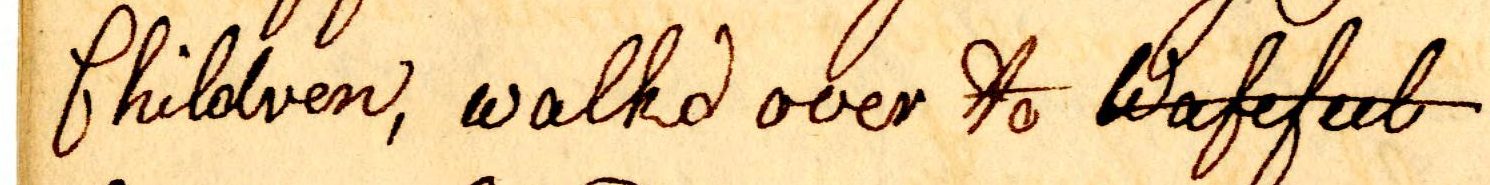Children, walkd over to [Wafefeel]
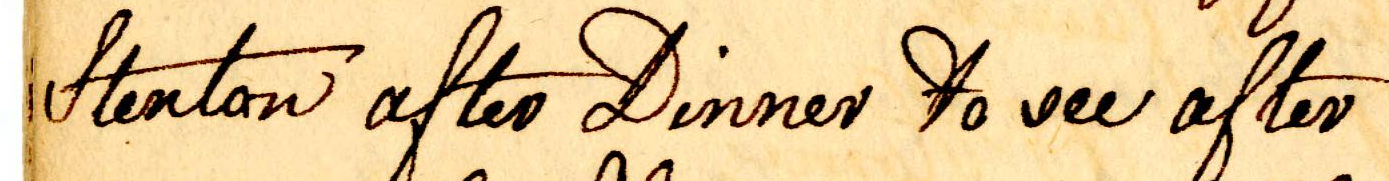Stenton after Dinner to see after
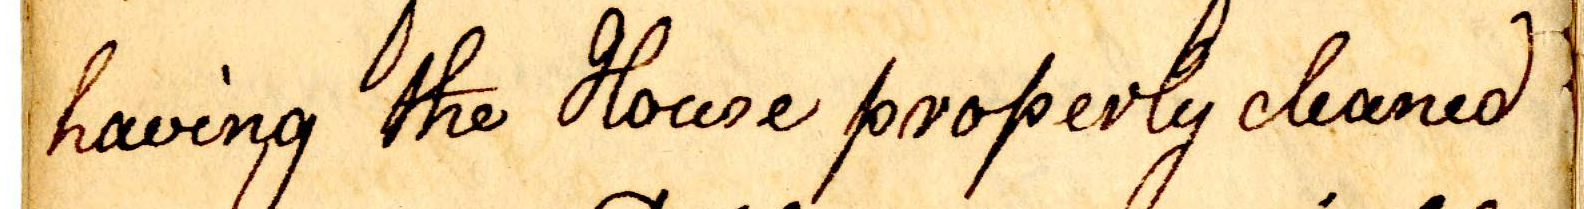having the House properly cleaned
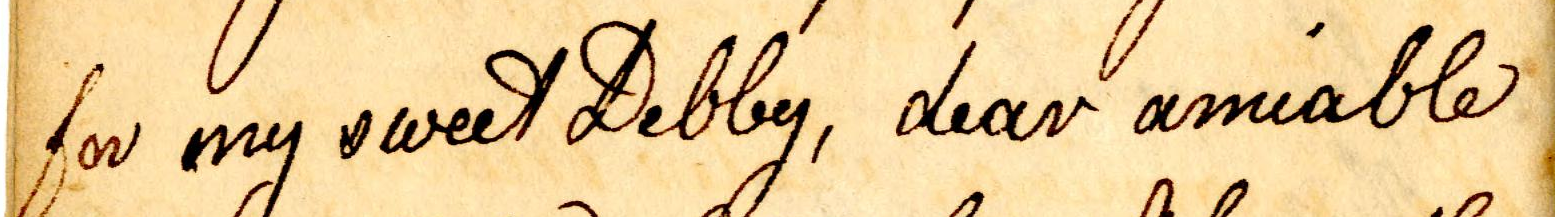for my sweet Debby, dear amiable
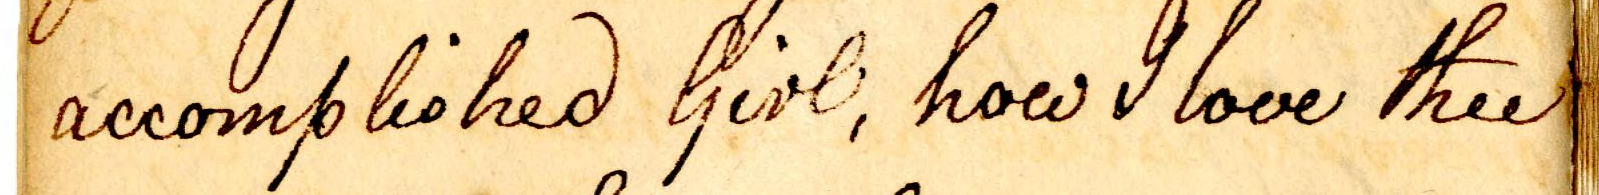accomplished Girl, how I love thee
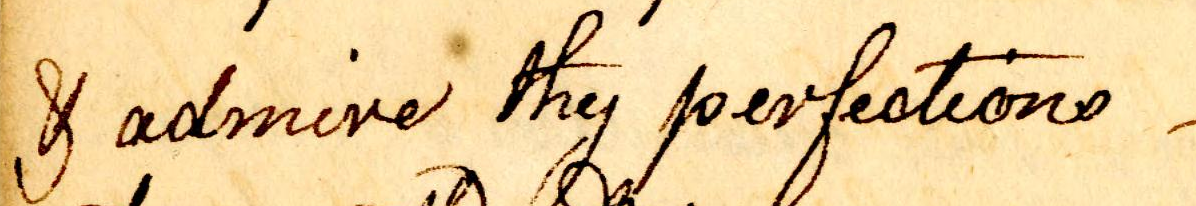& admire thy perfections
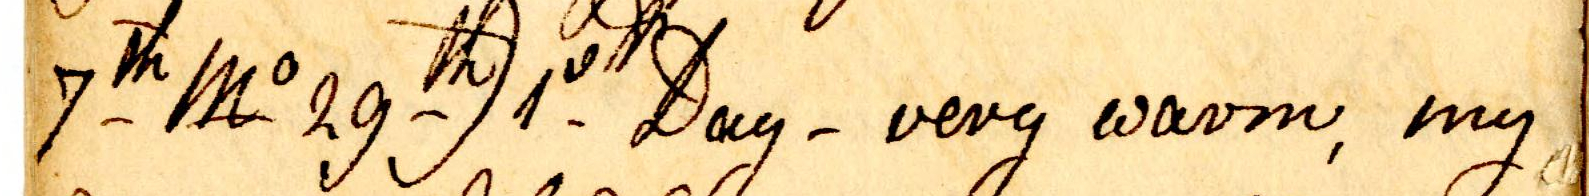7^th M^o 29^th) 1^st Day- very warm, my
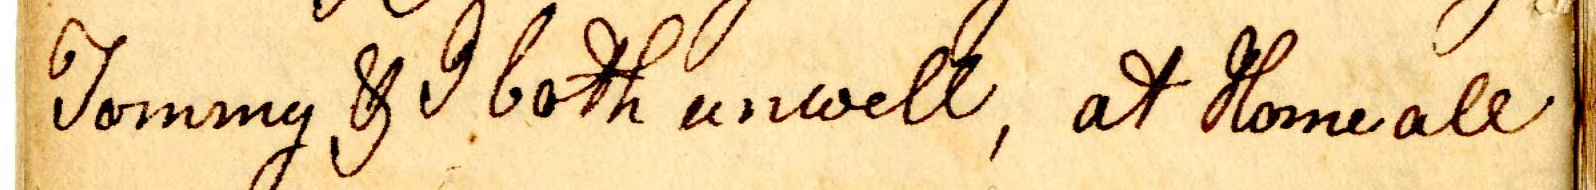Tommy & I both unwell, at Home all
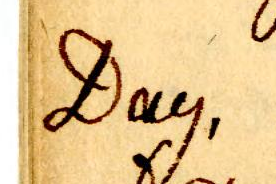Day,
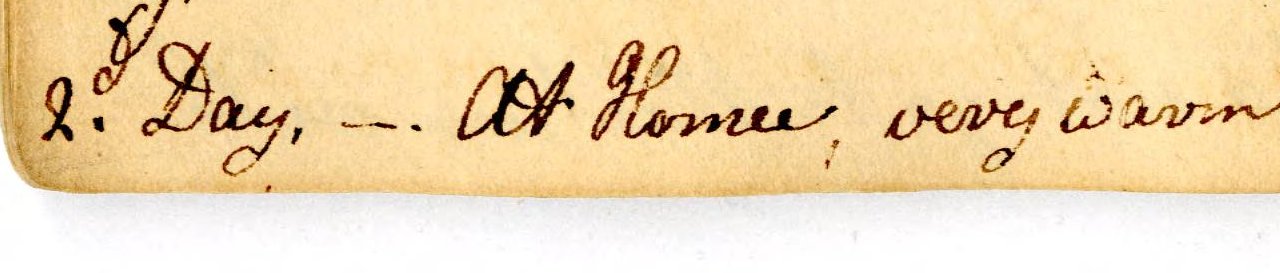2^d. Day,- At Homee, very warm
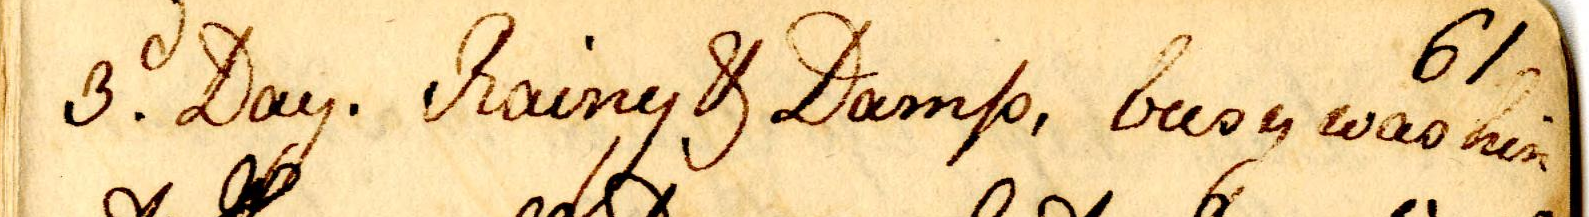3^d. Day. Rainy & Damp, busy was hin
